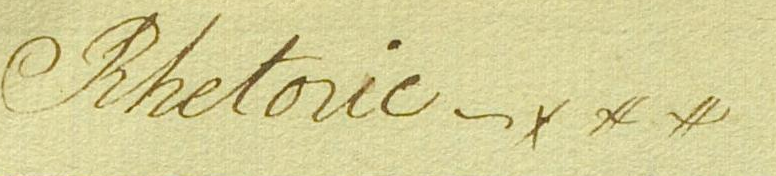Rhetoric
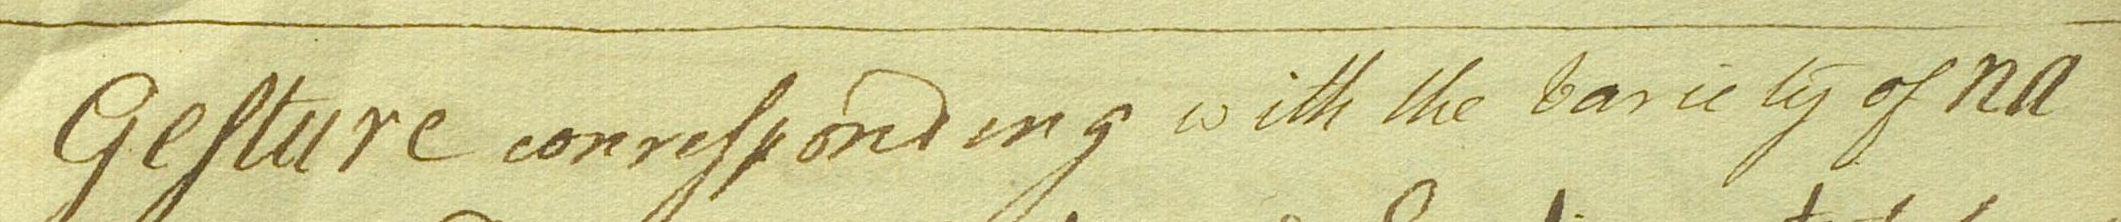Gesture Corresponding with the variety of Na-
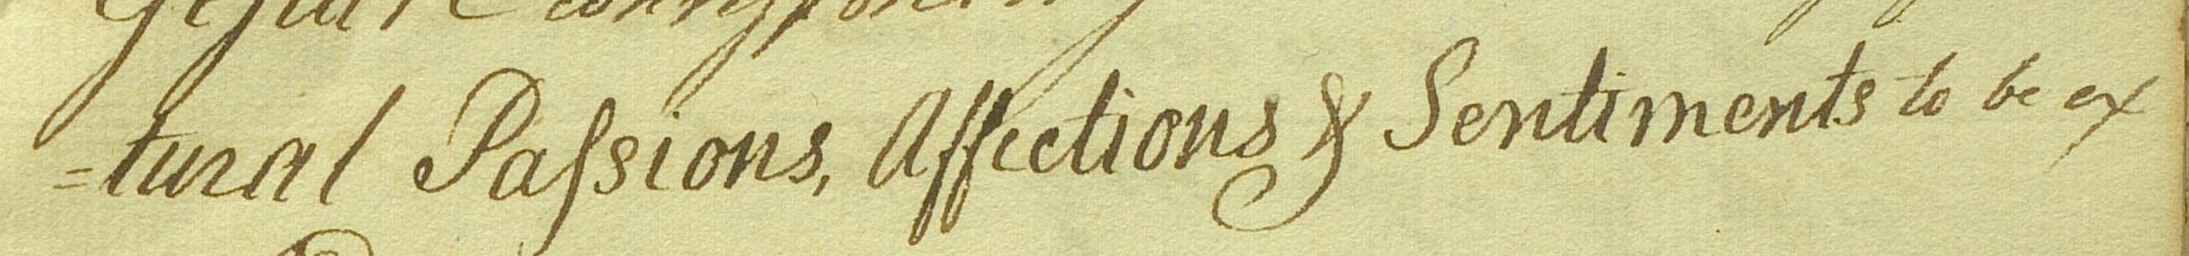-tural Passions, Affections & Sentiments to be ex-
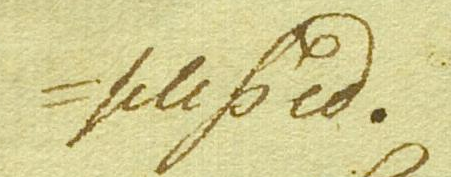-pressed.
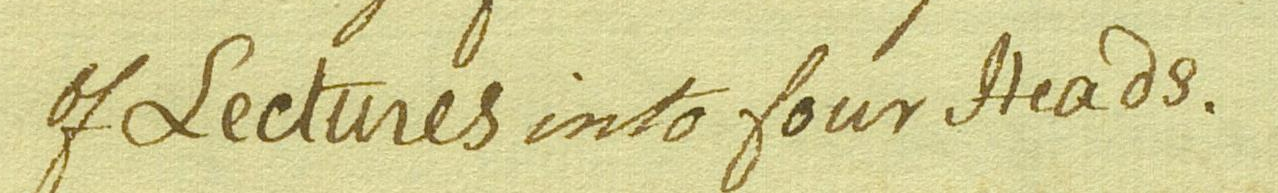of Lectures into four Heads.
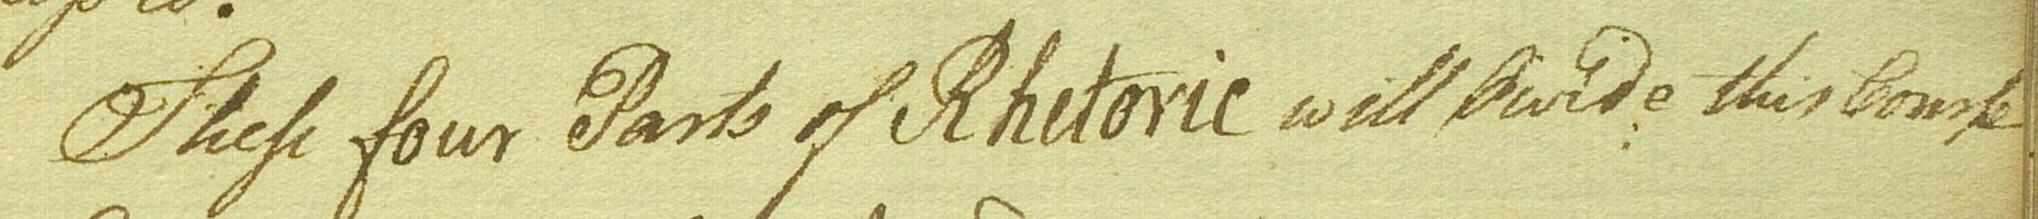These four Parts of Rhetoric will Guide this Course
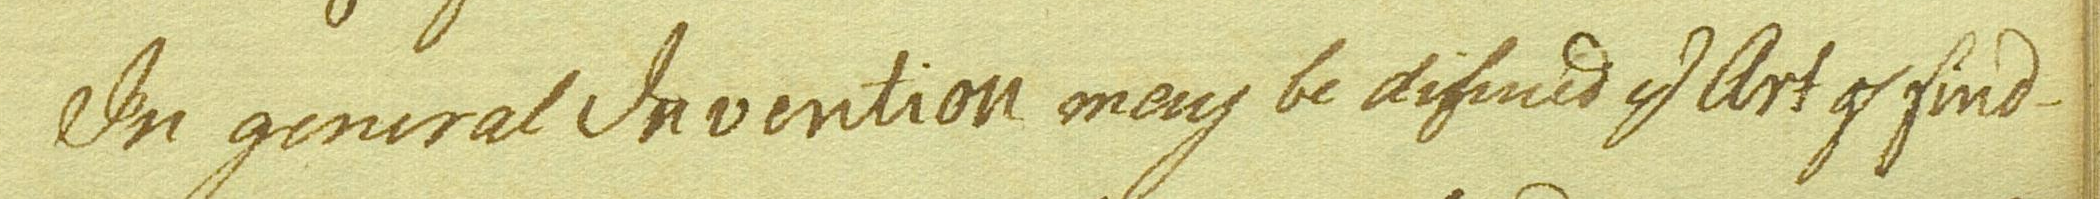In general Invention may be defined as Art of find-
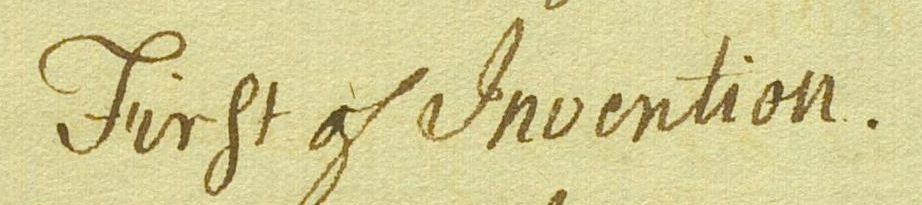First of Invention.
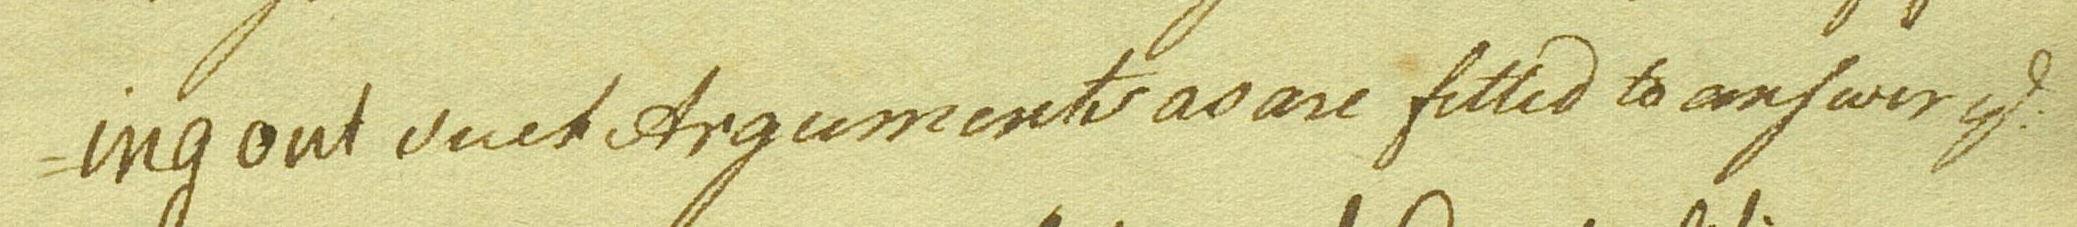-ing out such Arguments as are fitted to answer y^e:
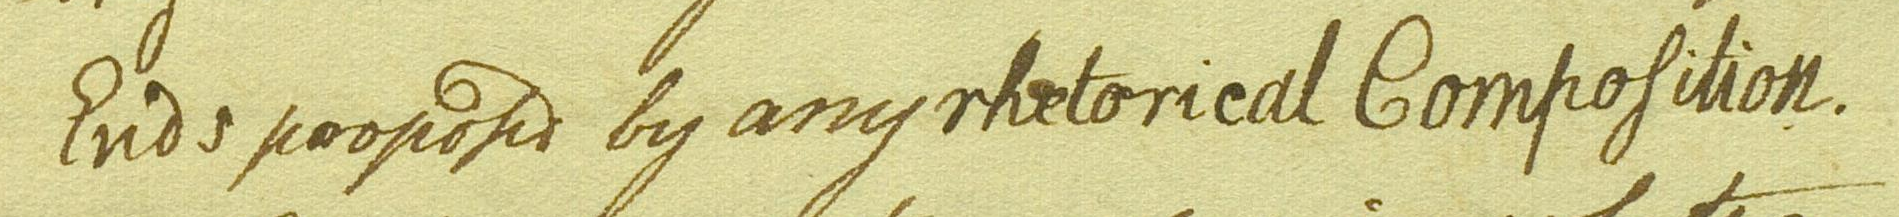Ends proposed by any rhetorical Composition.
